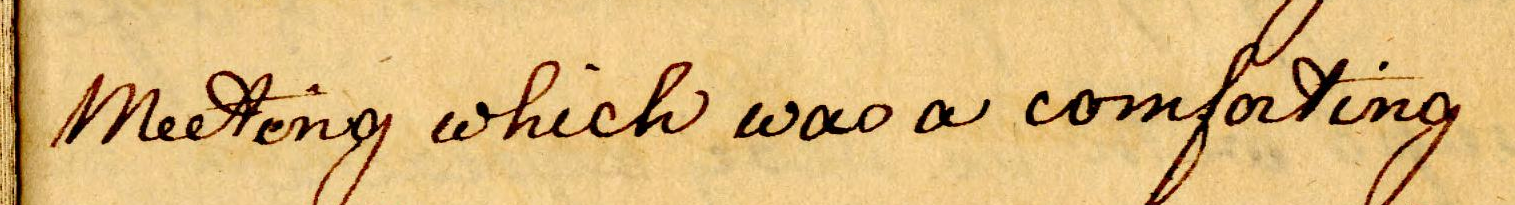Meeting which was a comforting
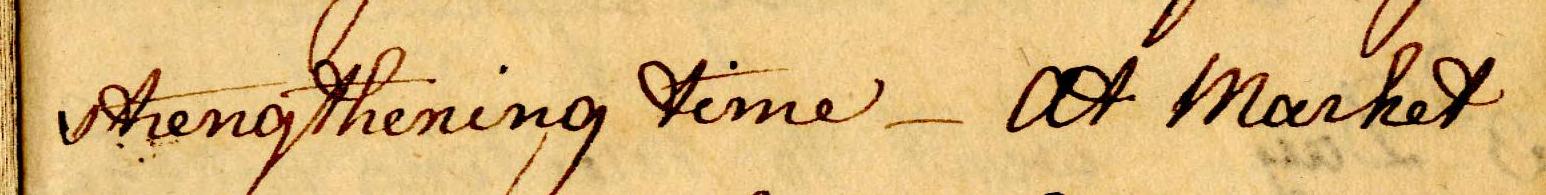strengthening time- At Market
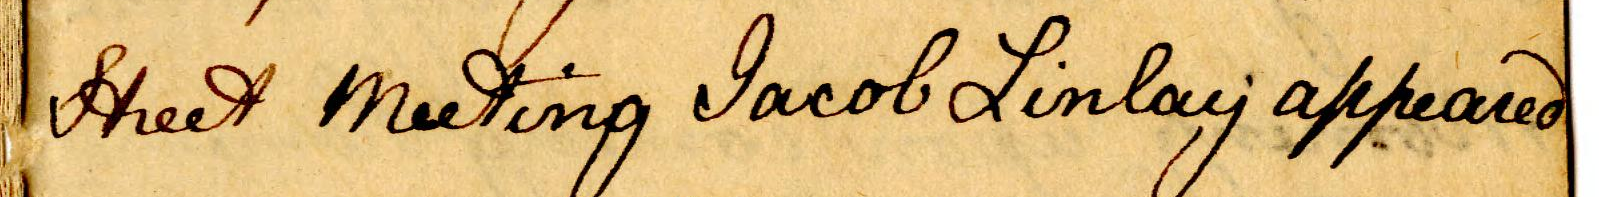Street Meeting Jacob Linlay appeared
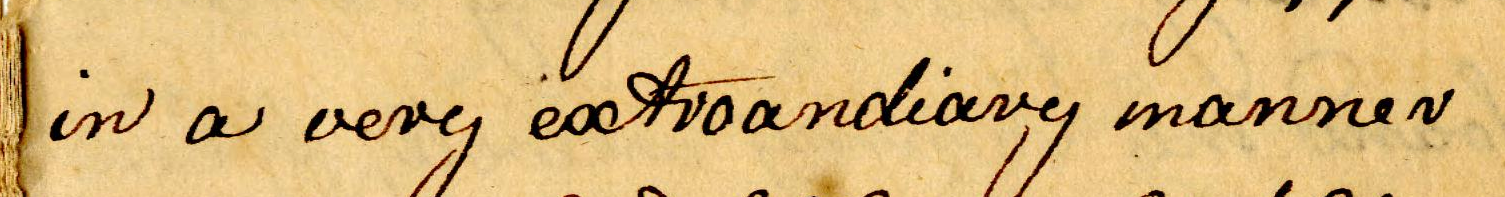in a very extroandiary manner
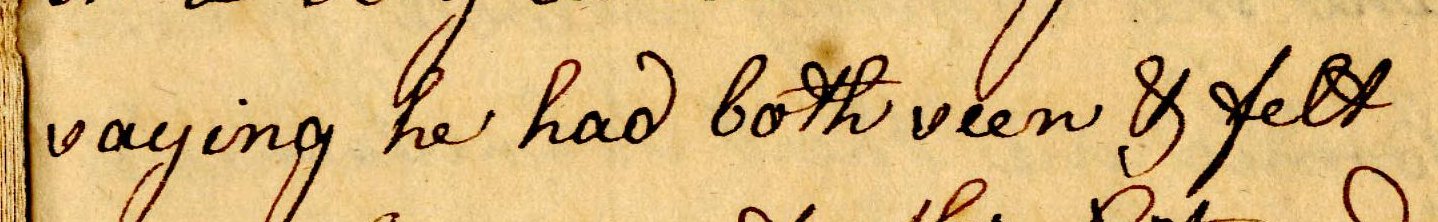saying he had both seen & felt
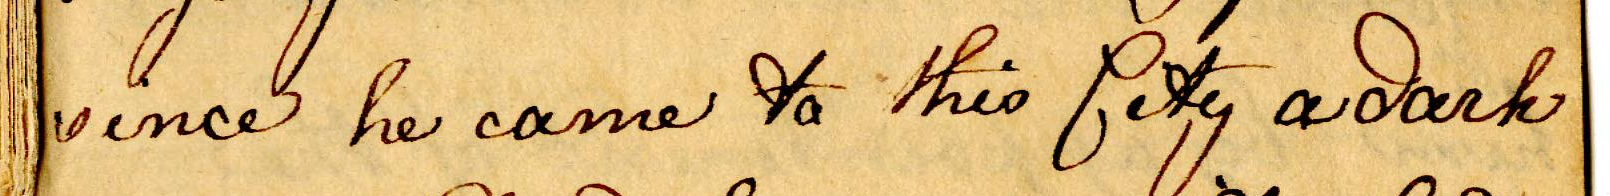since he came to this City a dark
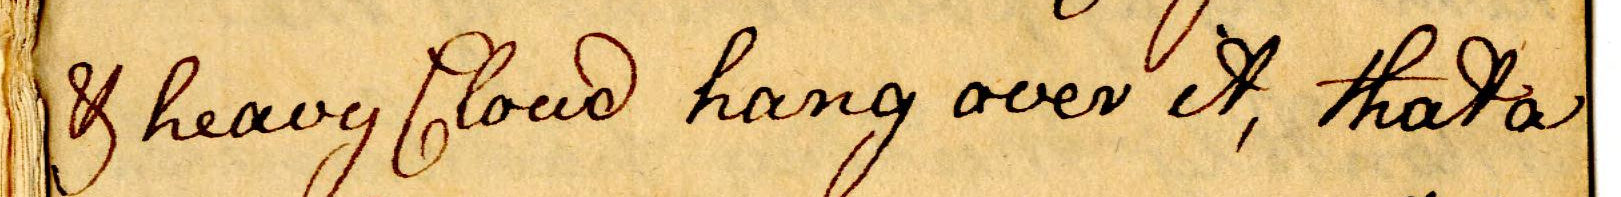& heavy Cloud hang over it, that a
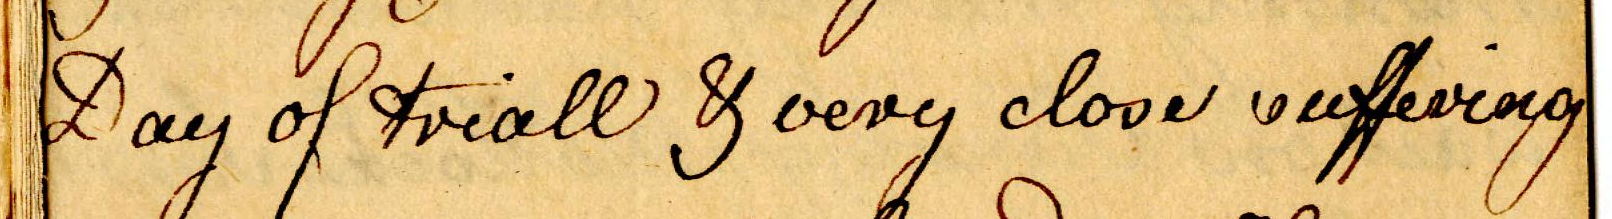Day of triall & very close suffering
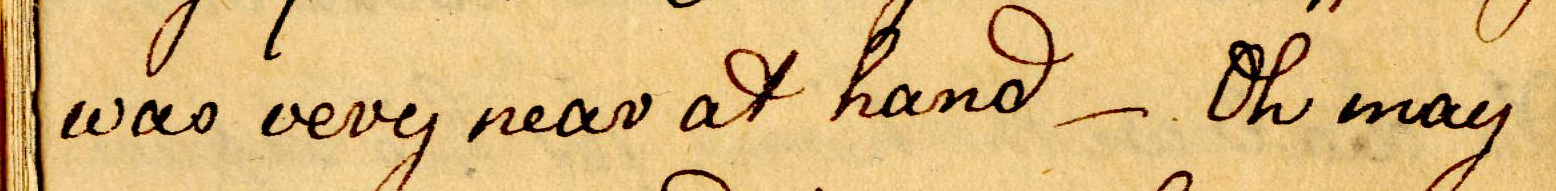was very near at hand- Oh may
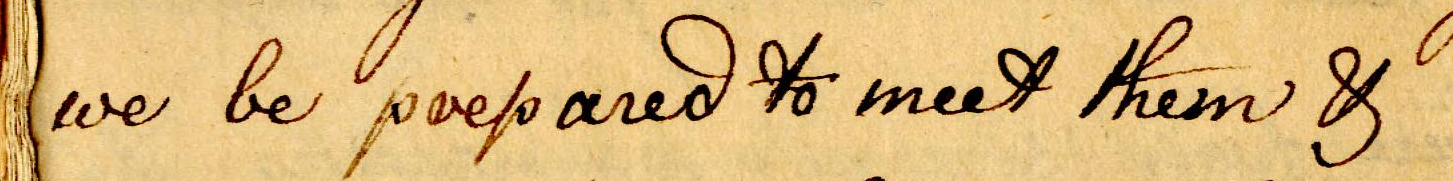we be prepared to meet them &
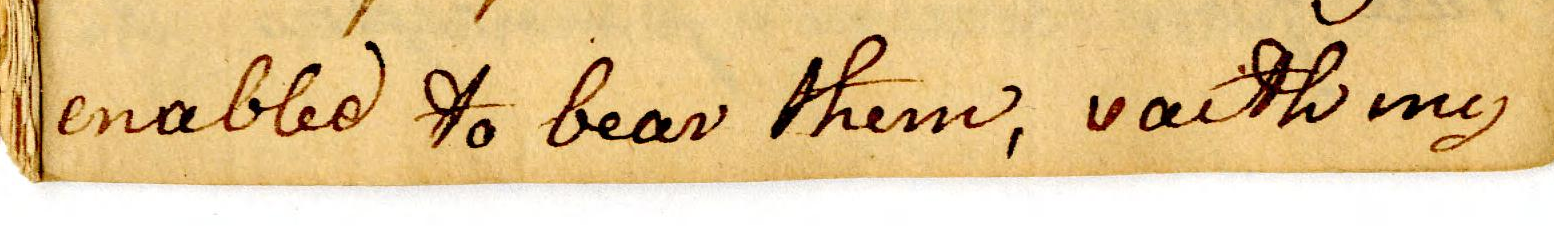enabled to bear them, saith my
